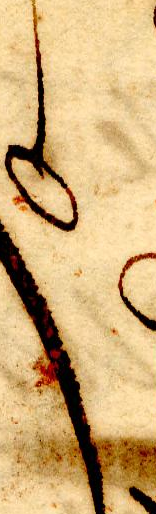To
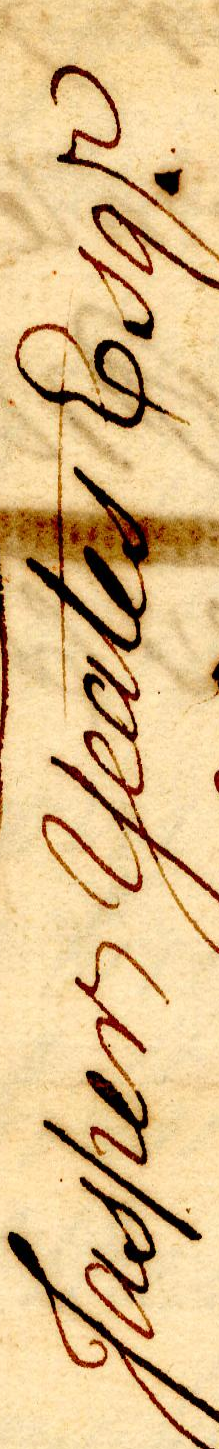Jasper Yeates Esq^r.
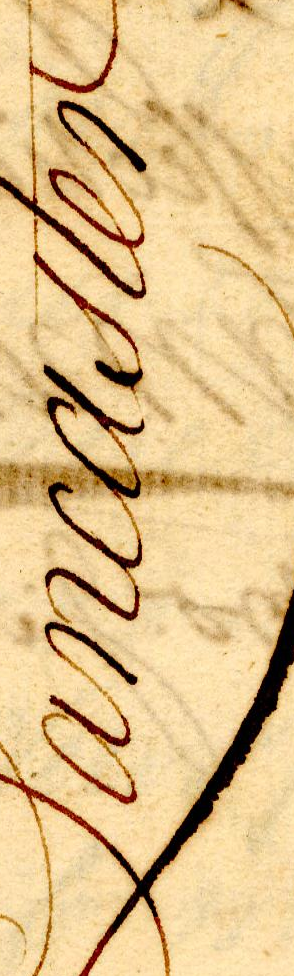Lancaster
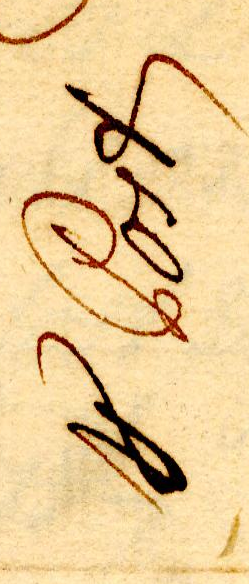Per Post
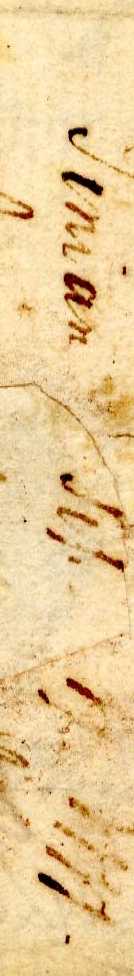Tinian Sep 17 1777
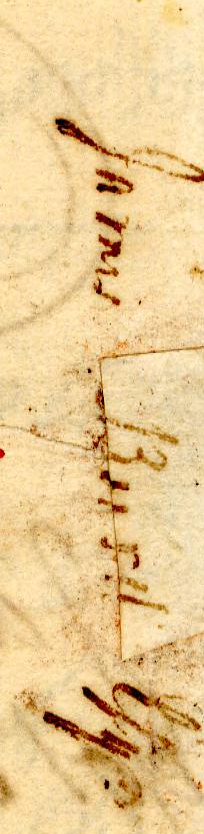James Burd Esq^r
